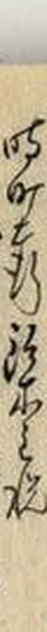時町奉行鈴木主税
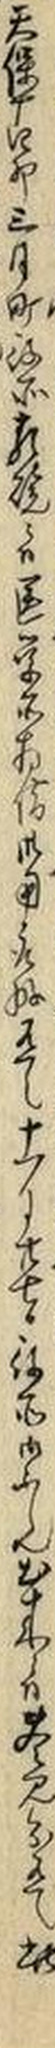一天保十四卯三月町役所類焼に付医学所拝借御用取扱有之十一月廿七日役所御ふしん出来候付夫々見分有之此
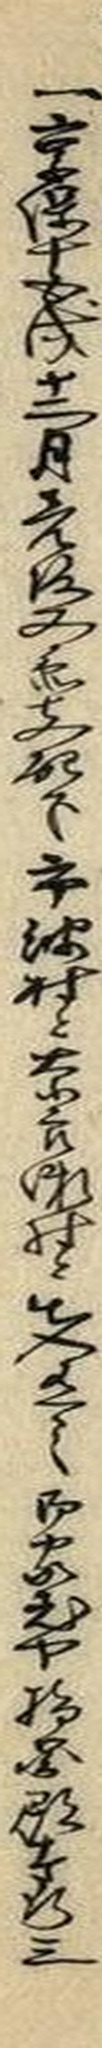一享保十五戌十二月彦坂又兵衛支配下市波村と奈良瀬村と出入有之御家老中指図郡奉行三
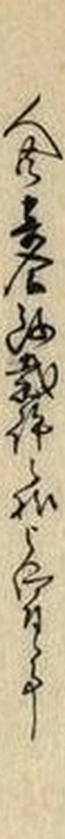人共寄合致裁許候様被仰付候事
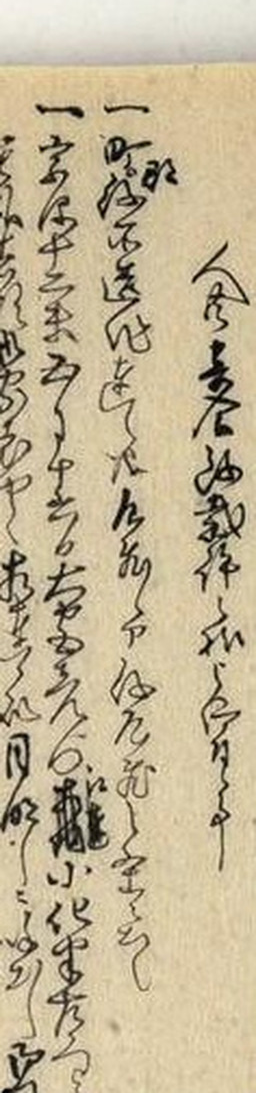一町郡役所造作達之儀屋敷之部役屋敷之条に出之
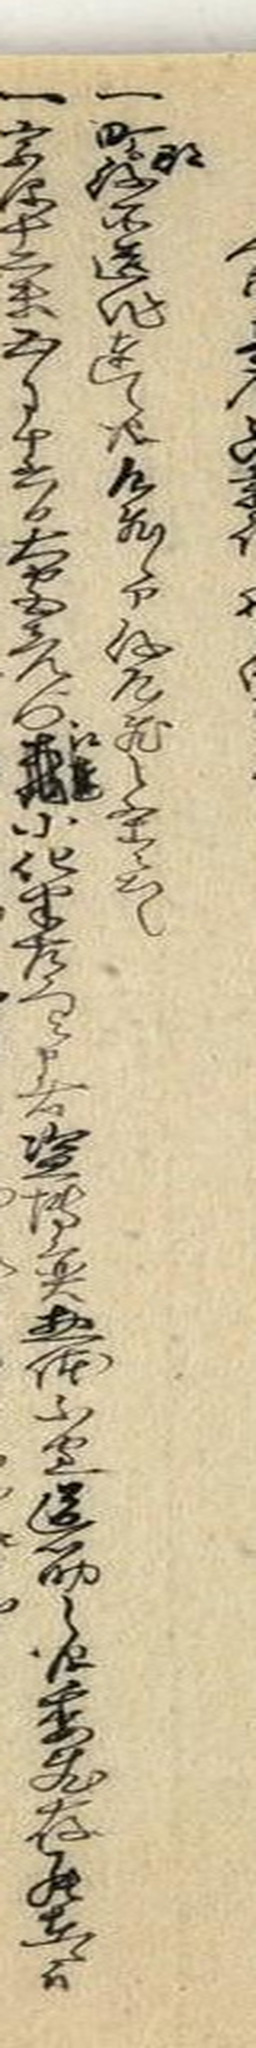一享保十二未五月十六日大宮彦右衛門え小化半左衛門と申者盗博奕惣体不宜道筋之儀委敷存罷在候に付
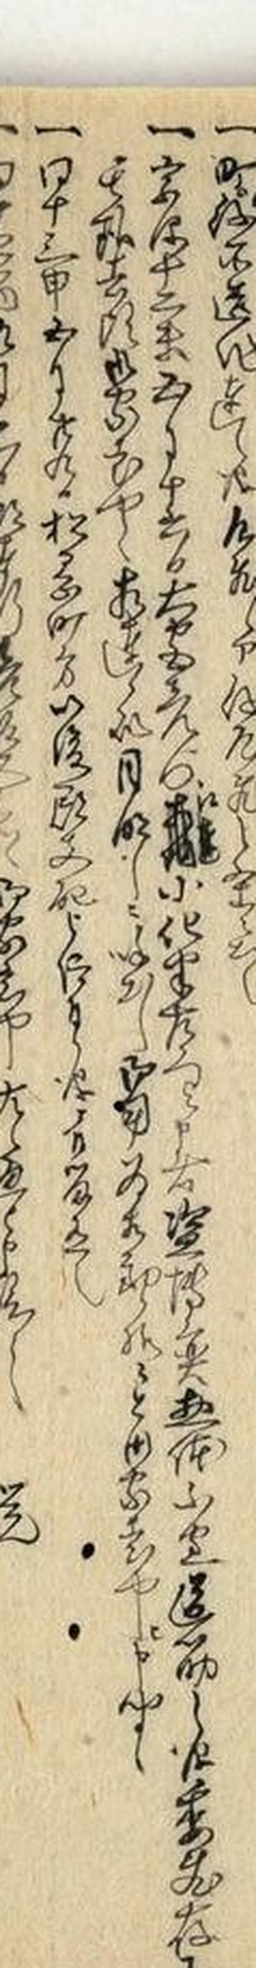其趣去頃御家老中へ相達候処目明しに呼出し御用為相勤候様にと御家老中被申聞候
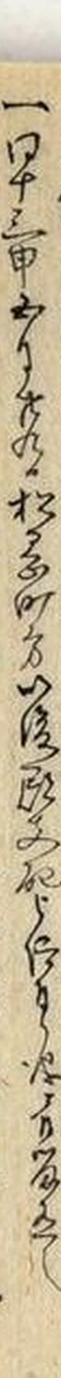一同十三申五月廿九日松岡町方以後郡支配被仰付候儀に付留有之
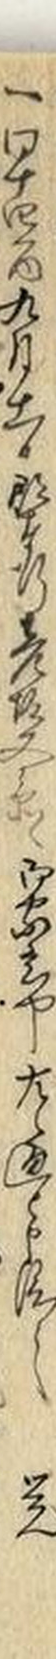一同十四酉九月十一日郡奉行彦坂又兵衛へ御家老中左之通被申渡之覚
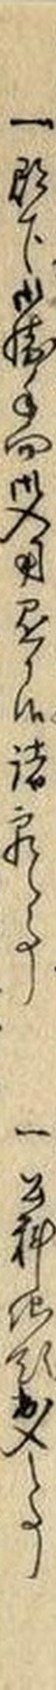一郡下御勝手向御入用懸り候諸願之事一公料他領出入之事
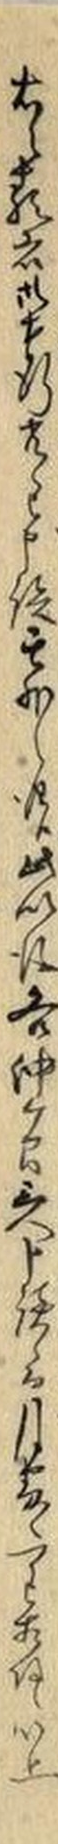右之類は御奉行共へ被申談其外之儀は此以後各仲ケ間三人申談候て月番へ可被相伺候以上

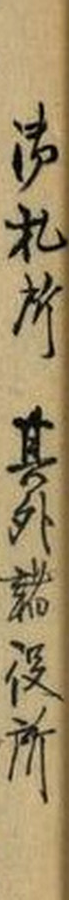御札所其外諸役所
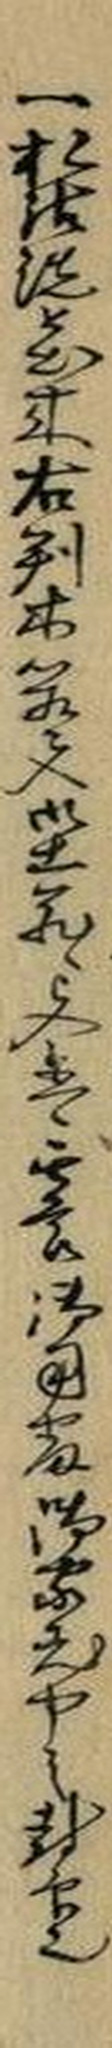一札銀洗被出来右判木箱に入御土蔵へ被入置候其節御用番御家老中之封印也
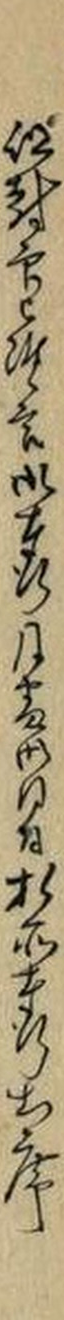但封印被附候節御奉行月番御目付札所奉行出席
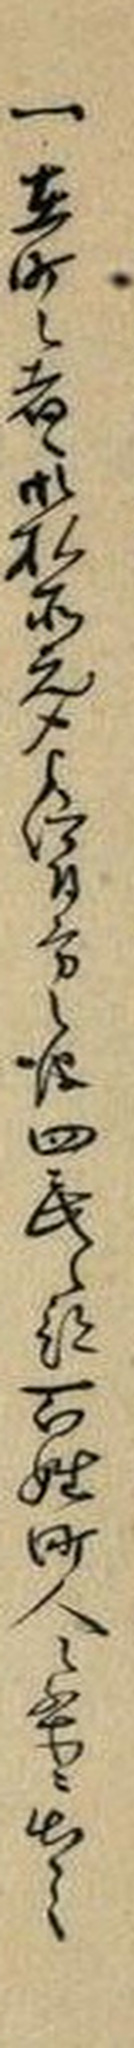一在町之者へ御札所元〆被仰付方之儀四民之部百姓町人之条に出之
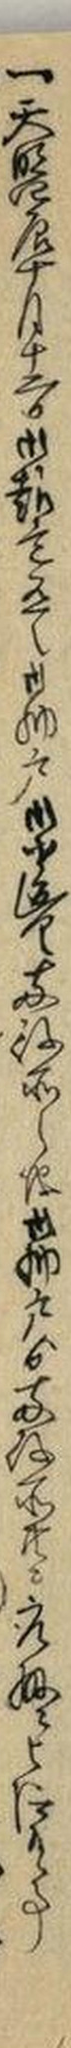一天明四辰十月十二日御趣意有之御納戸御小道具両役所之儀御納戸ゟ両役所共に取扱に被仰付候事
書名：御城下諸事之部
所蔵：福井県文書館 Fukui Prefectural Archives
